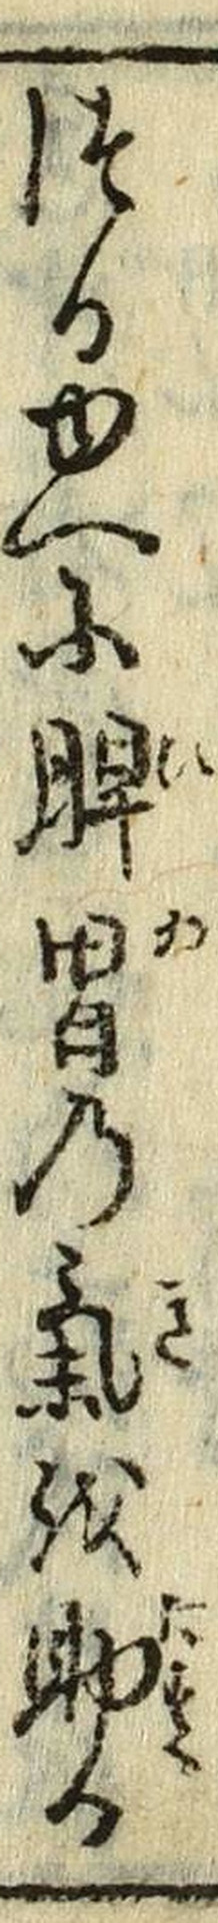つるゆへに脾胃の気を助る
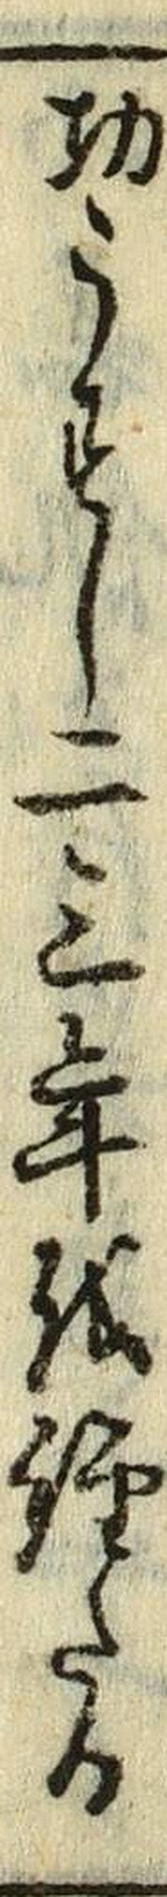功うすし煮二三年を経たる
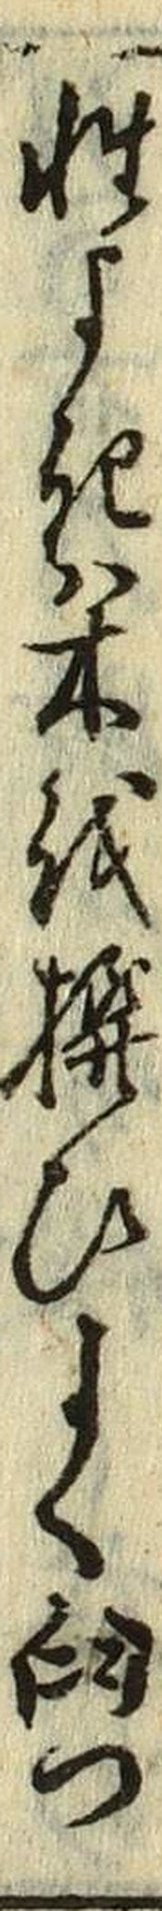性よき米を撰ひよく臼つ
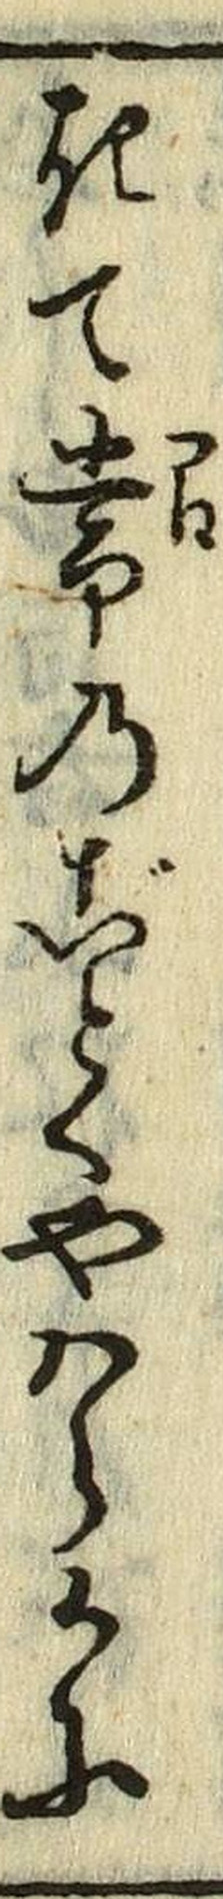きて常のごとくやはらかに
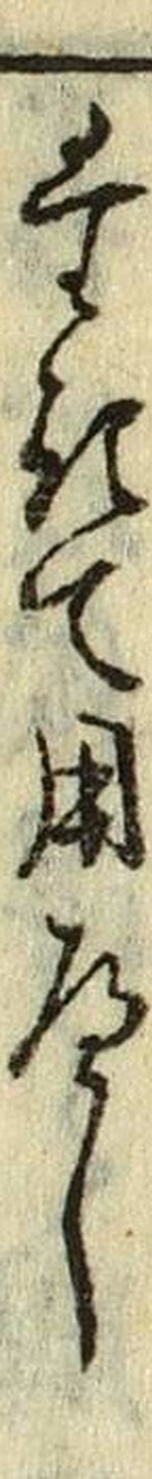たきて用へし
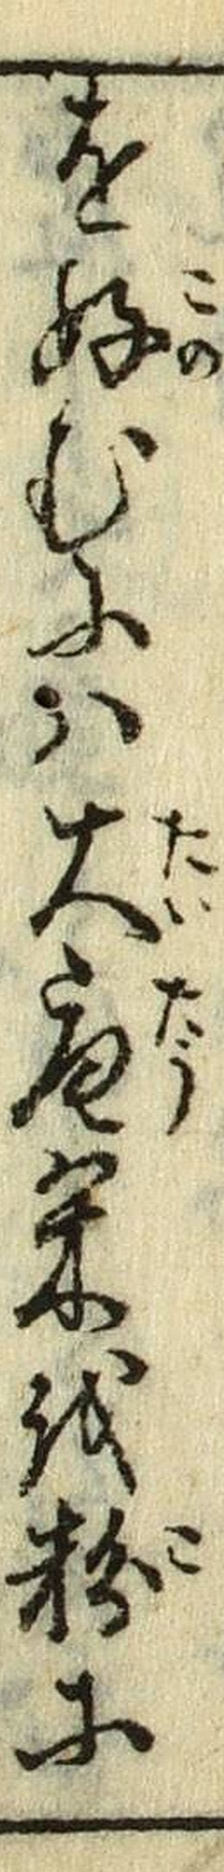を好むには大唐米を粉に
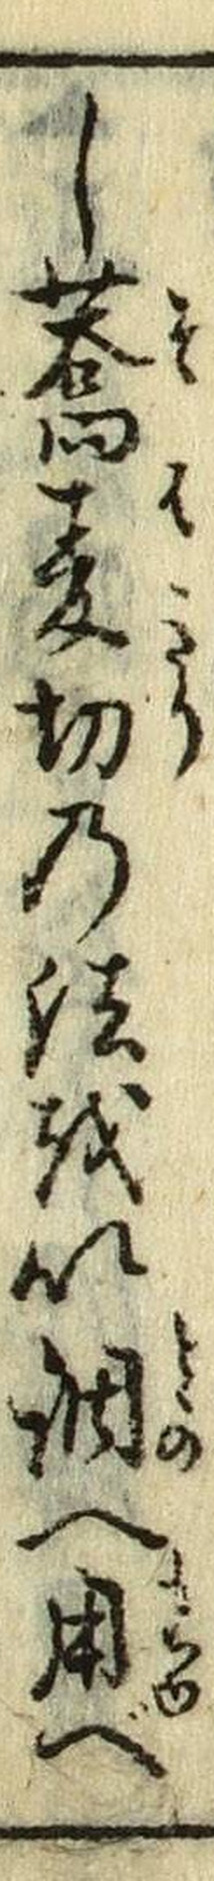し蕎麦切の法を以調へ用べ
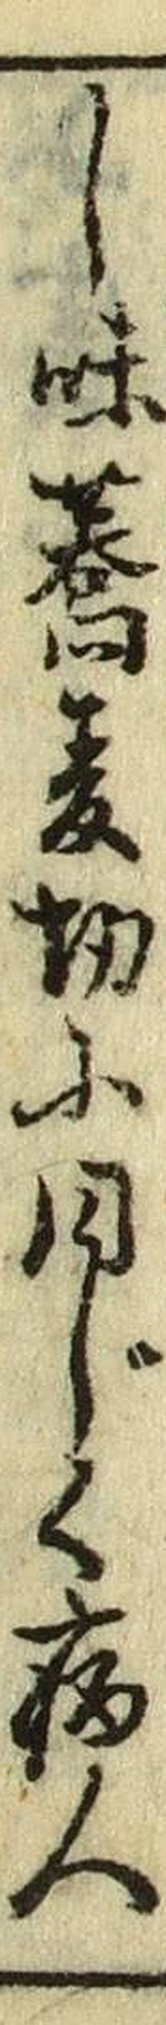し味蕎麦切に同じく病人

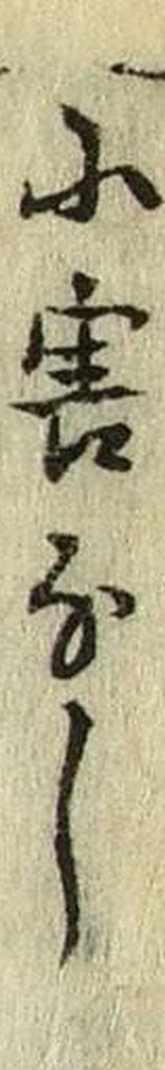に害なし
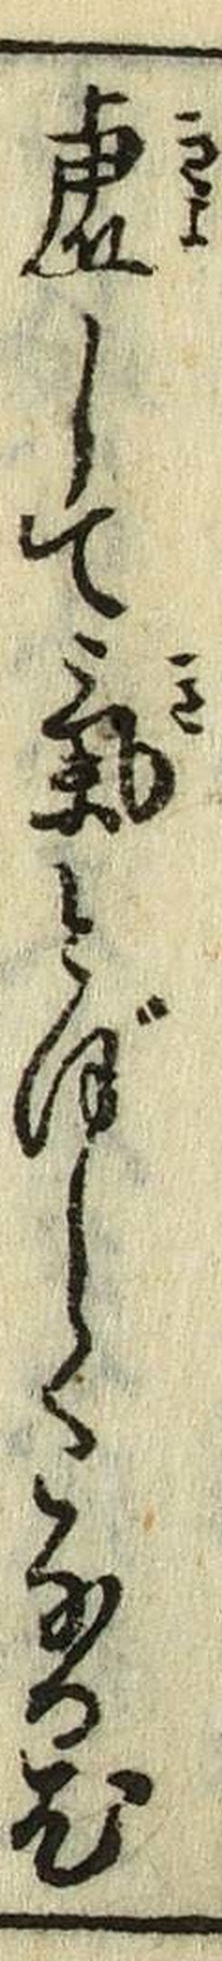虚して気とぼしくなる尤
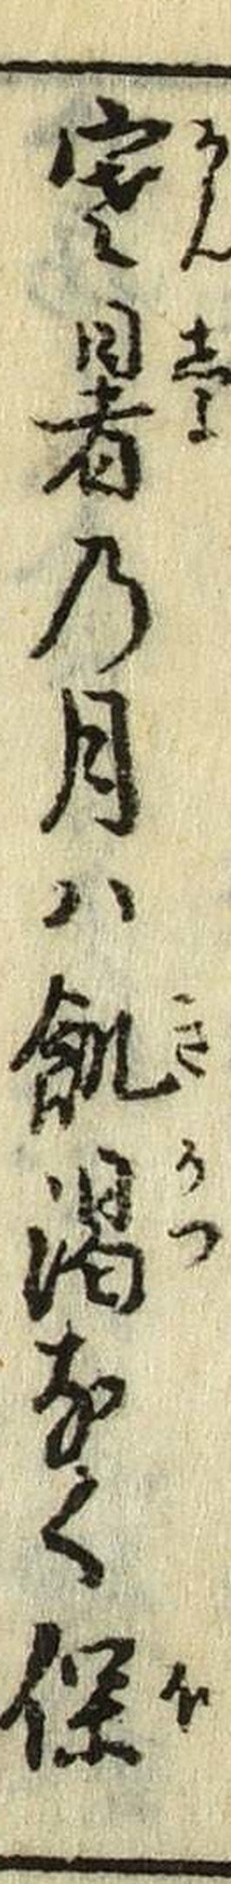寒暑の月は飢渇なく保
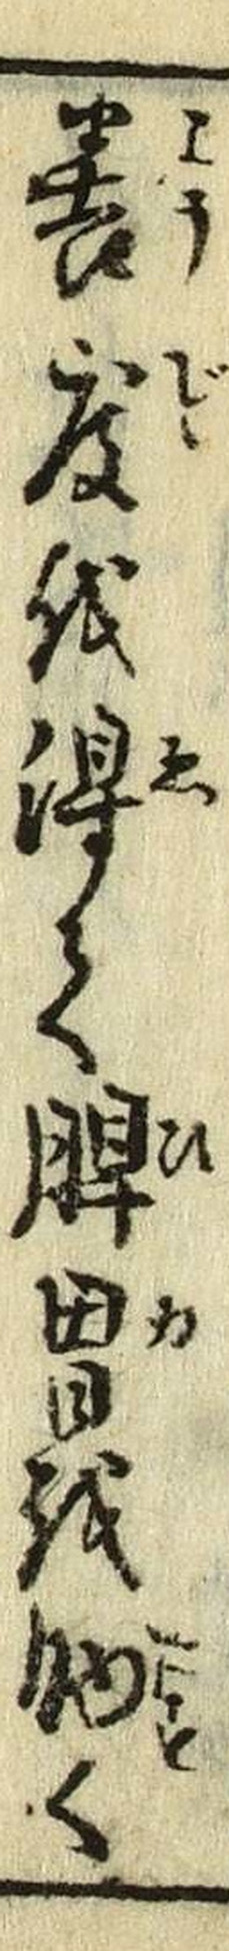養度を得て脾胃を助く
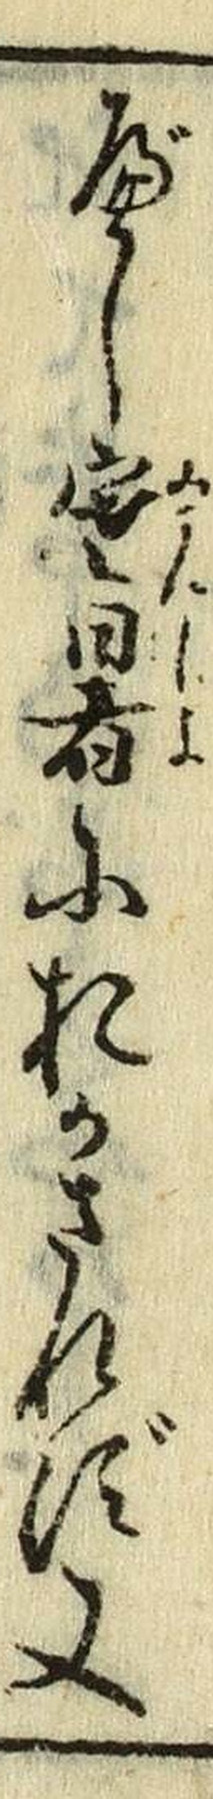べし寒暑におかされず又
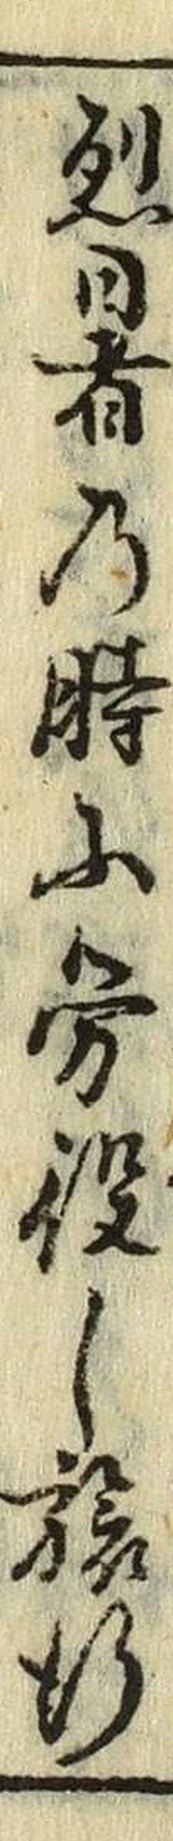烈暑の時に労役し旅行
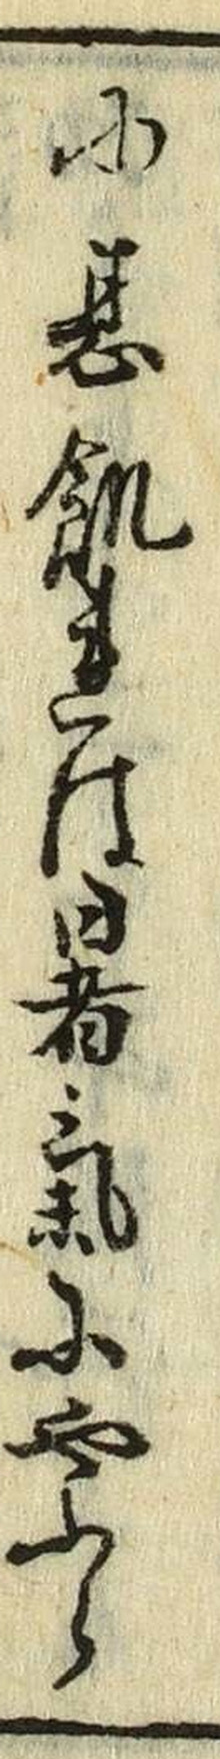に甚飢れは暑気にやふら
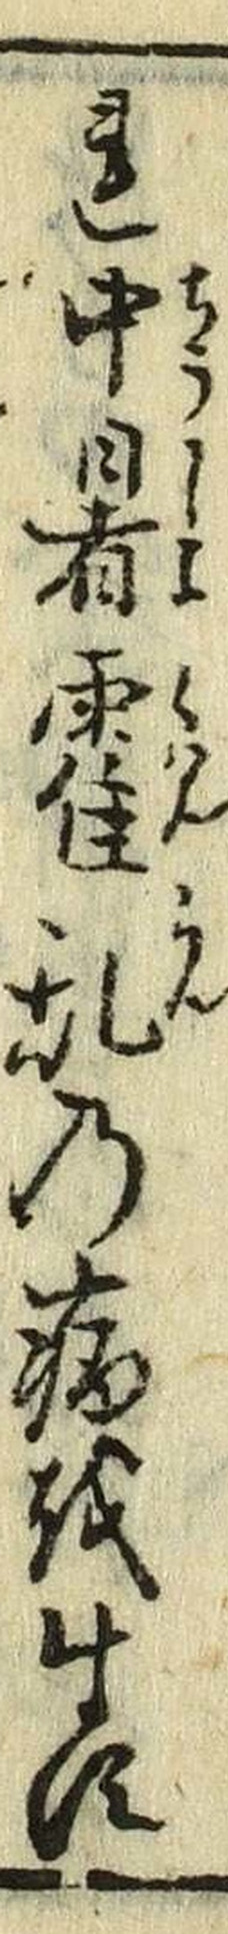れ中暑霍乱の病を生す
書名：居家養生記
